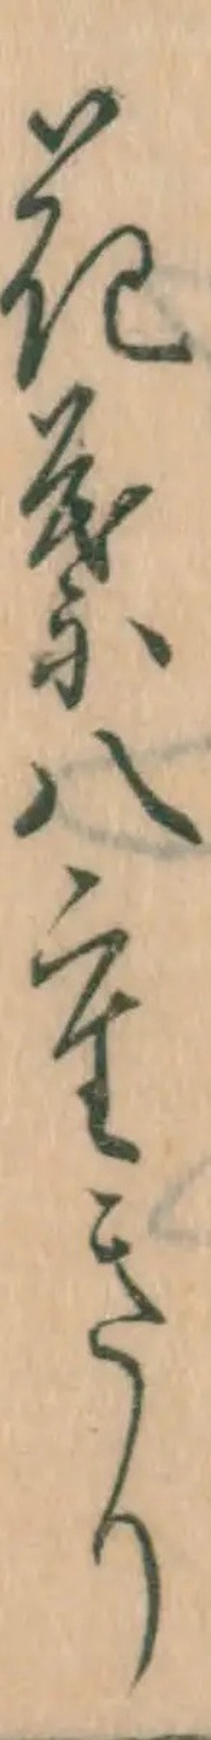花葉八重きり
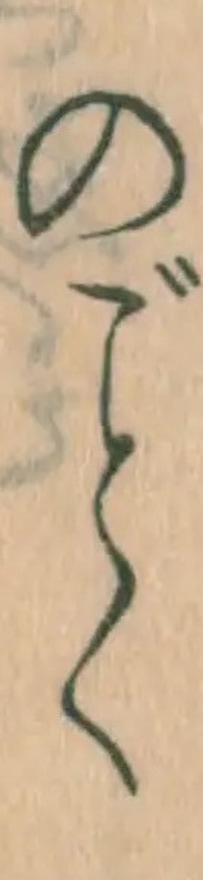のごとく
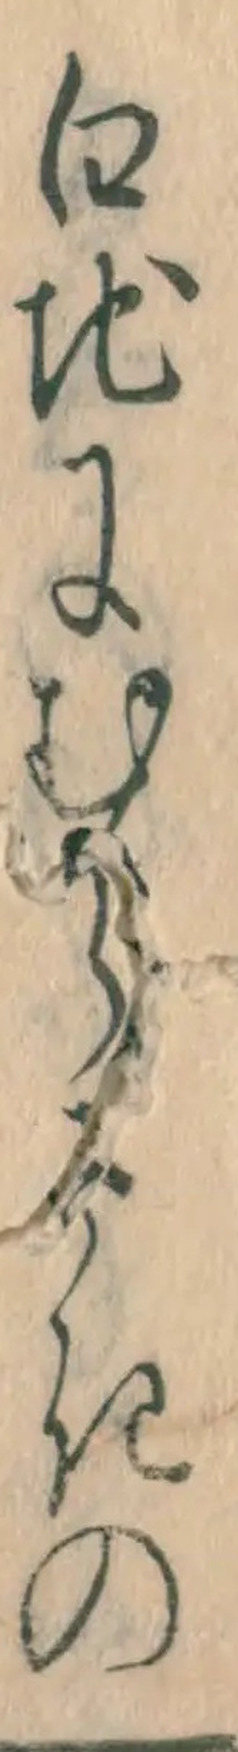白地にむらさきの
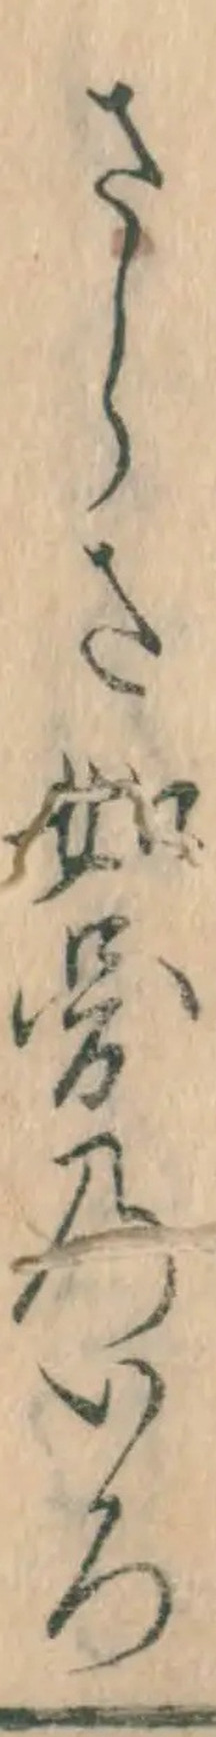さらさ如図のいろ

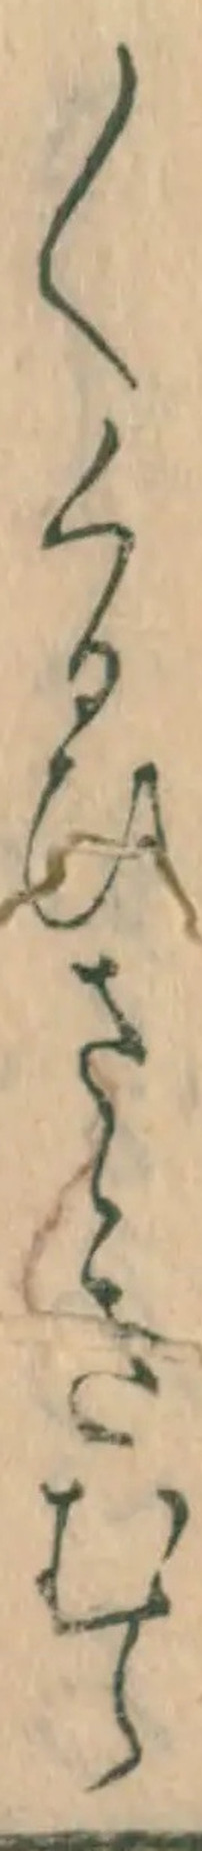〳〵くるひさきむら
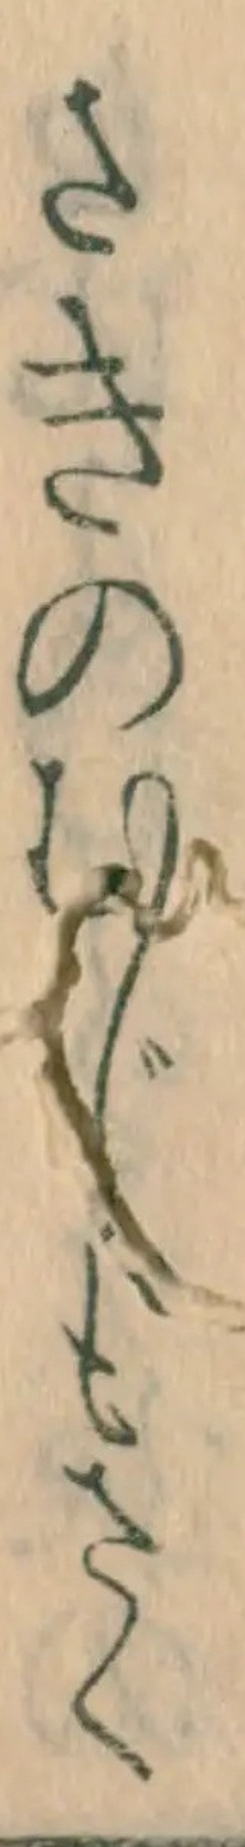さきのむじもさく
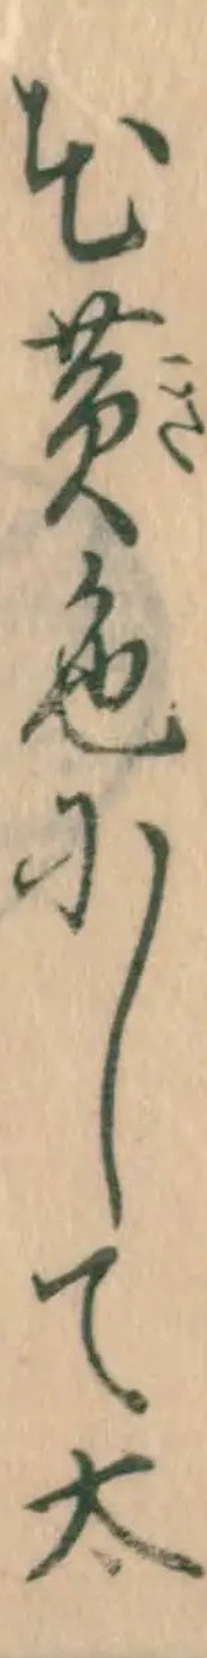花黄色にして太
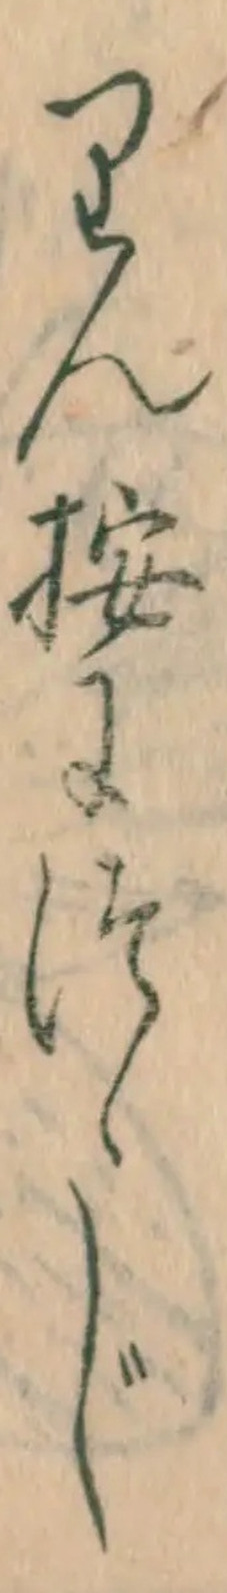りん按につゝじ
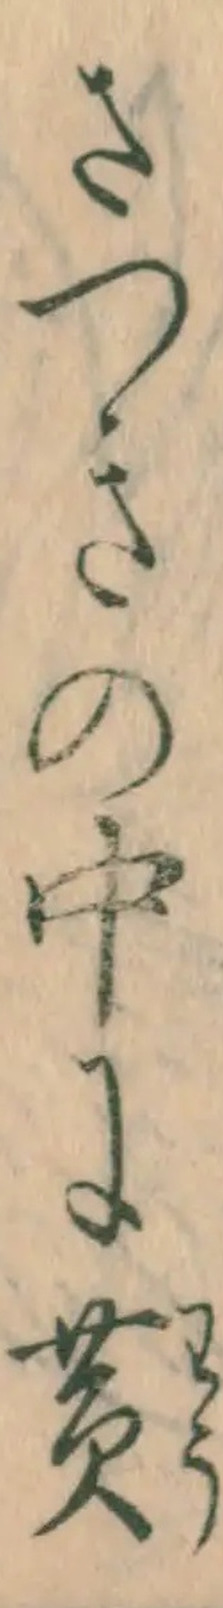さつきの中に黄
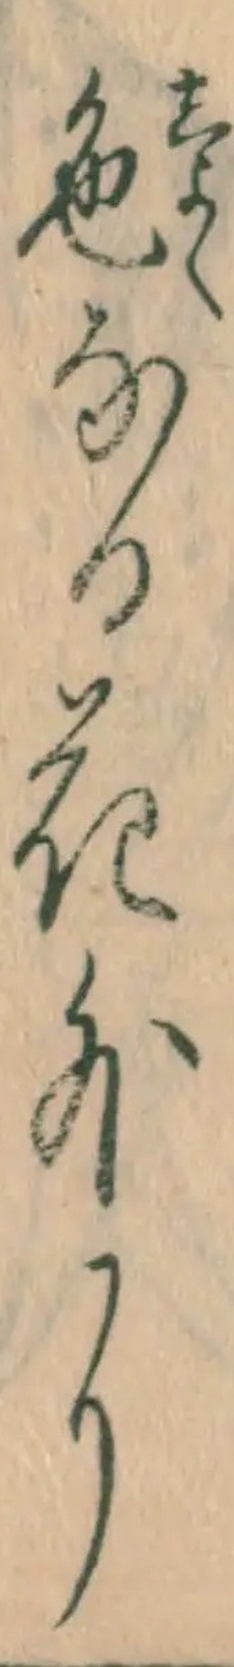色なる花外に
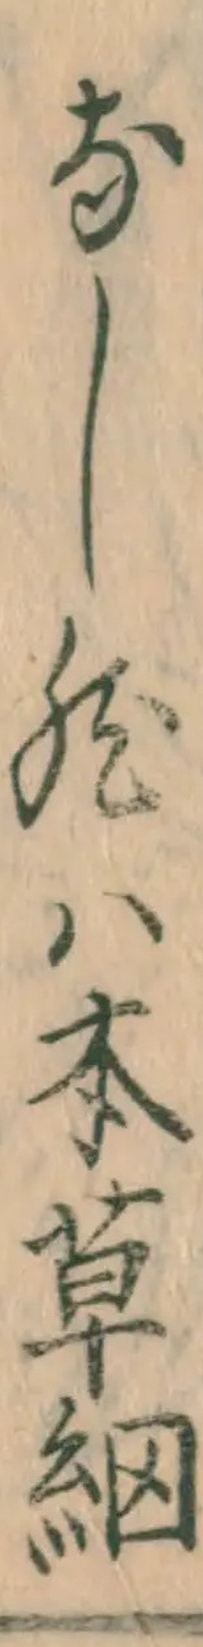なし然は本草網
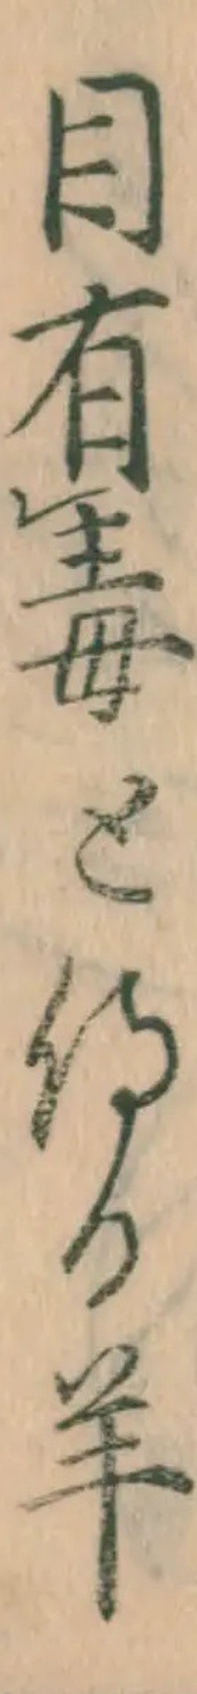目有毒と侍る羊
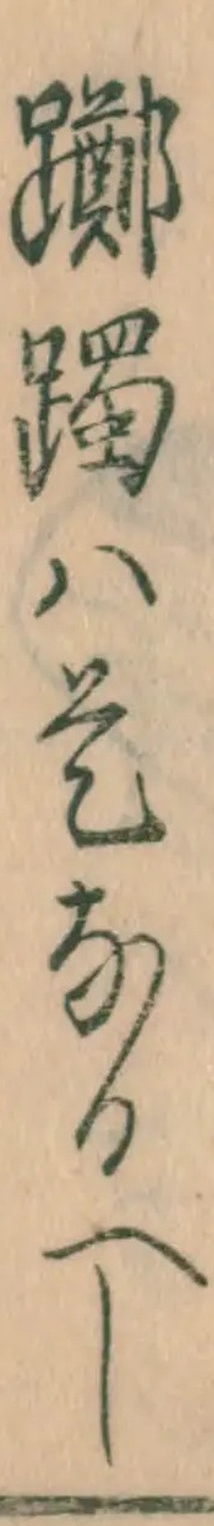躑躅は是なるへし
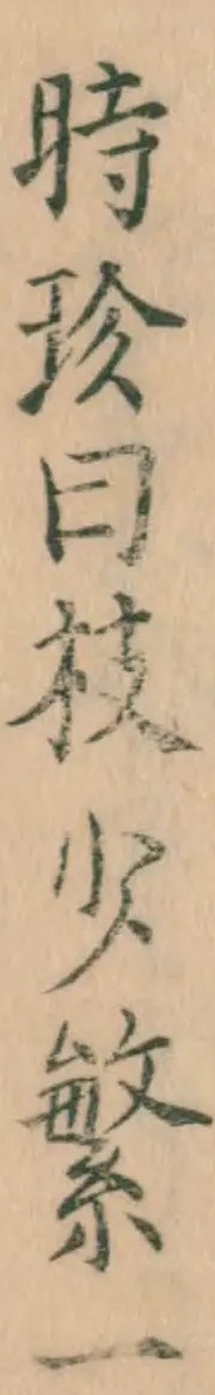時珍日枝少繁一
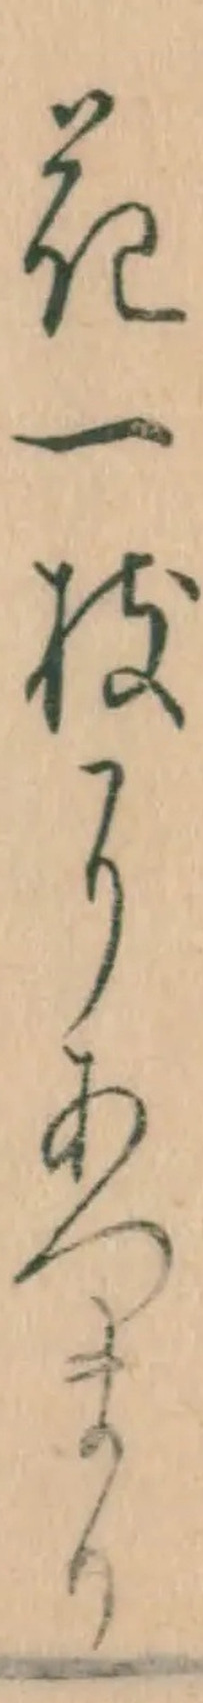花一枝にあつまり
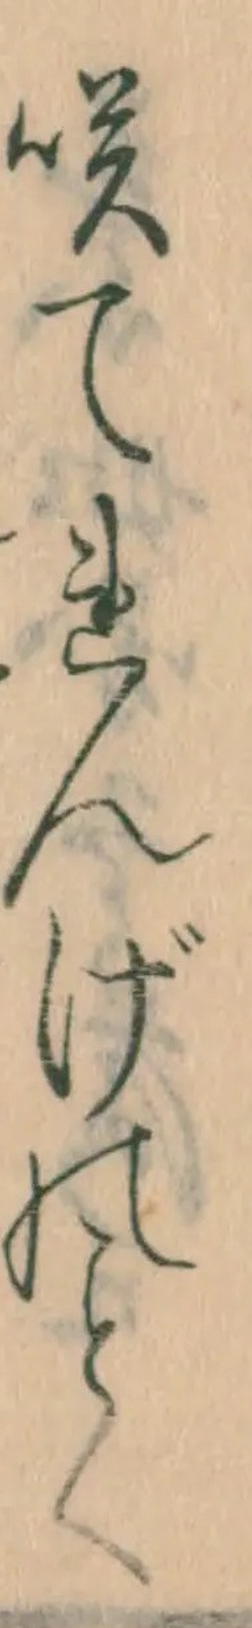咲てれんげのことく
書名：錦繍枕 5巻. [3]
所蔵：国立国会図書館 National Diet Library, JAPAN
